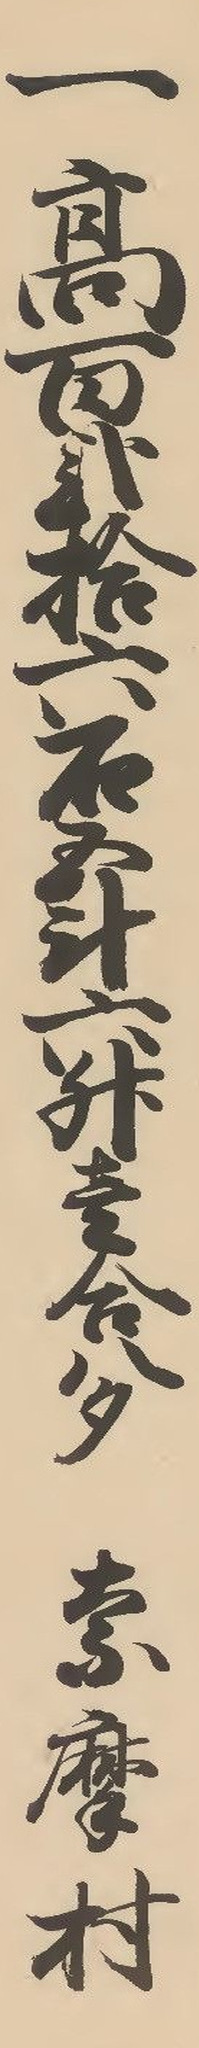一髙百弐拾六石五斗六升壱号八夕奈摩村
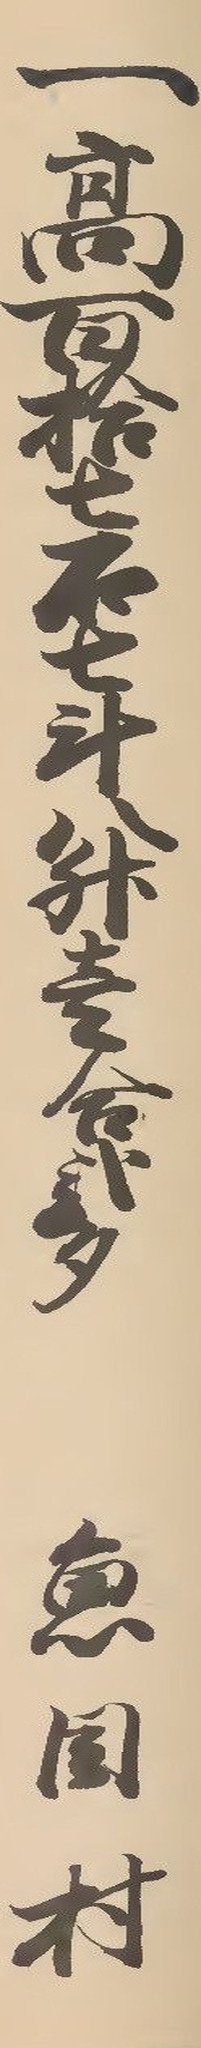一髙百拾七石七斗八升壱号壱夕魚目村
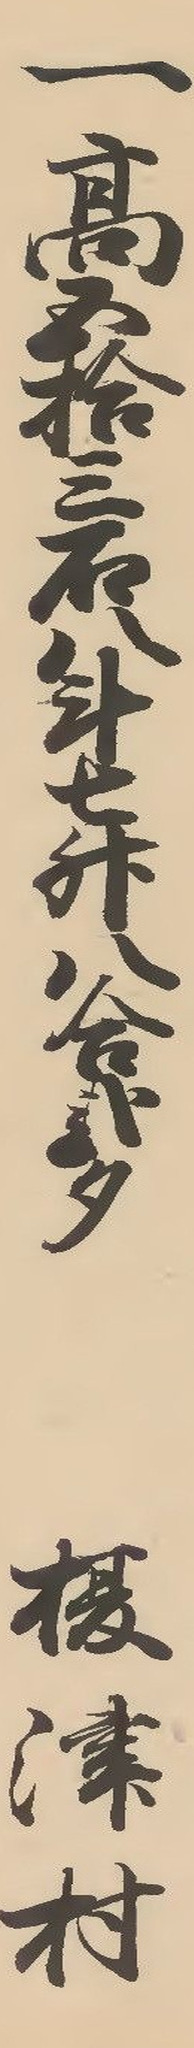一髙五拾三石八斗七升八合弐夕榎津村
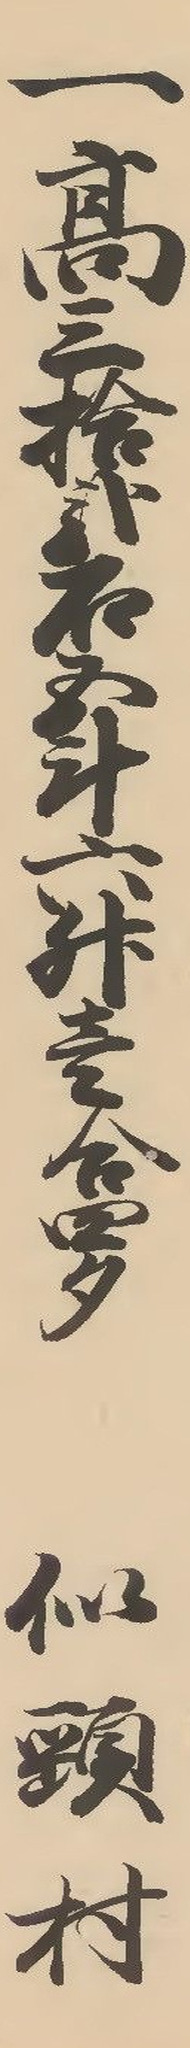一髙三拾弐石五斗六升壱合四夕似頸村
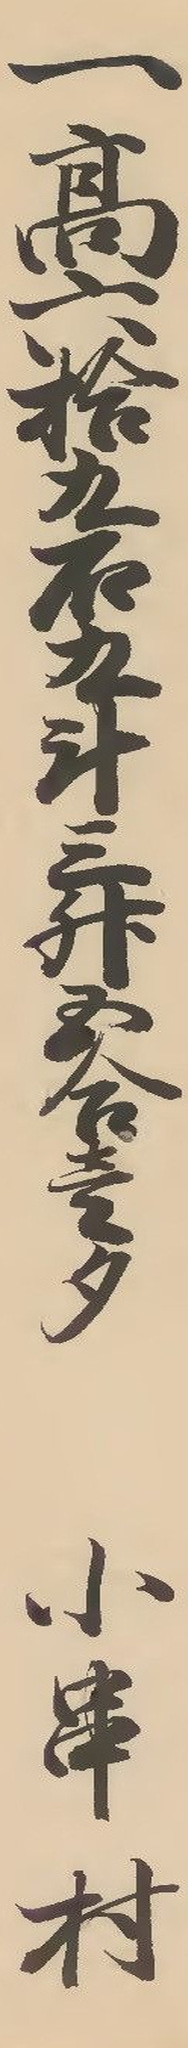一髙六拾九石九斗三升五合壱夕小串村

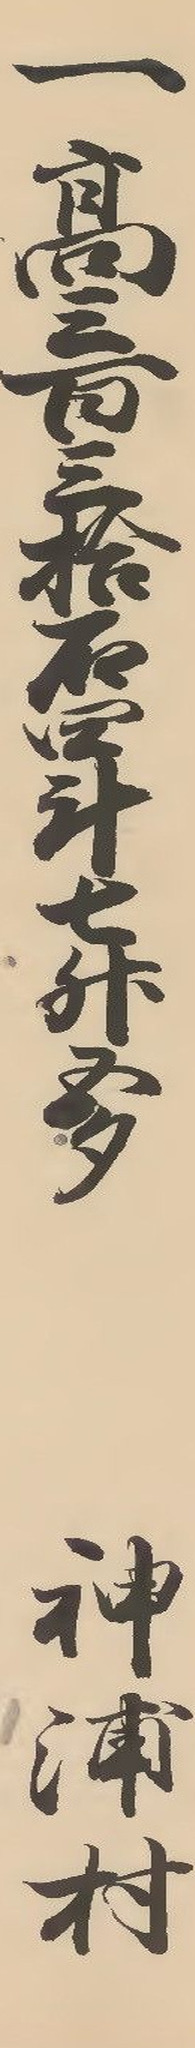一髙三百三拾石四斗七升五夕神浦村
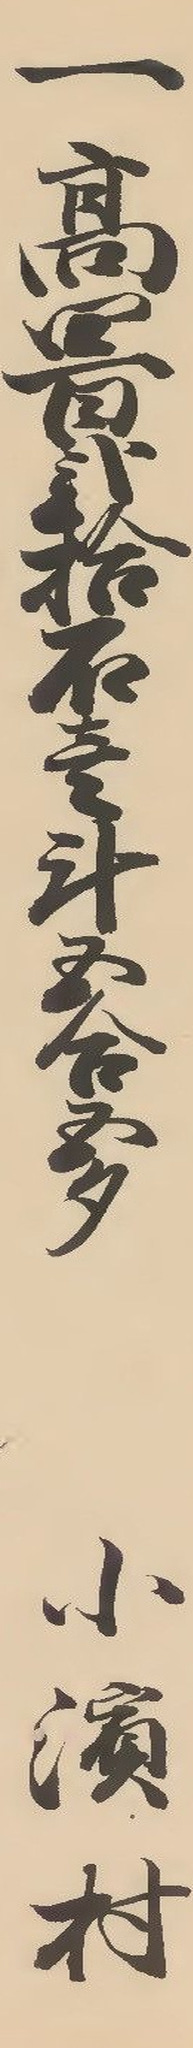一髙四百弐拾石壱斗五合五夕小濱村
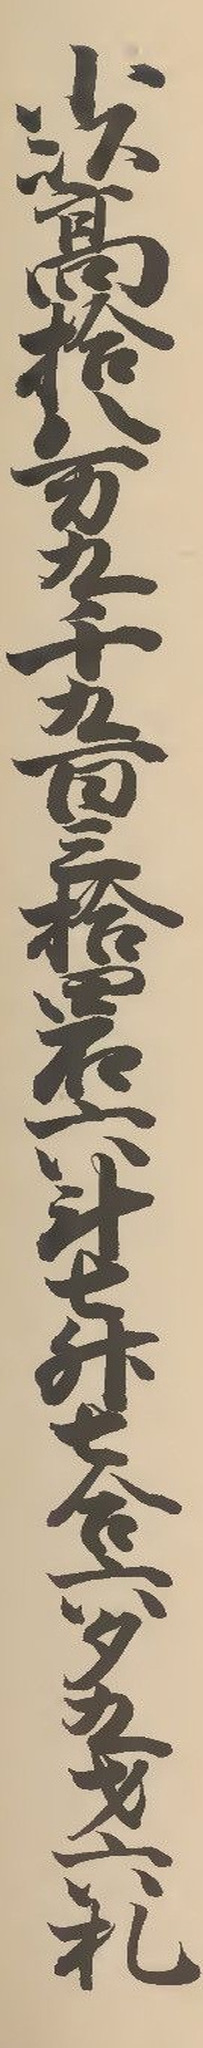小以髙拾八万九千九百三拾四石六斗七升七合六夕九才六札

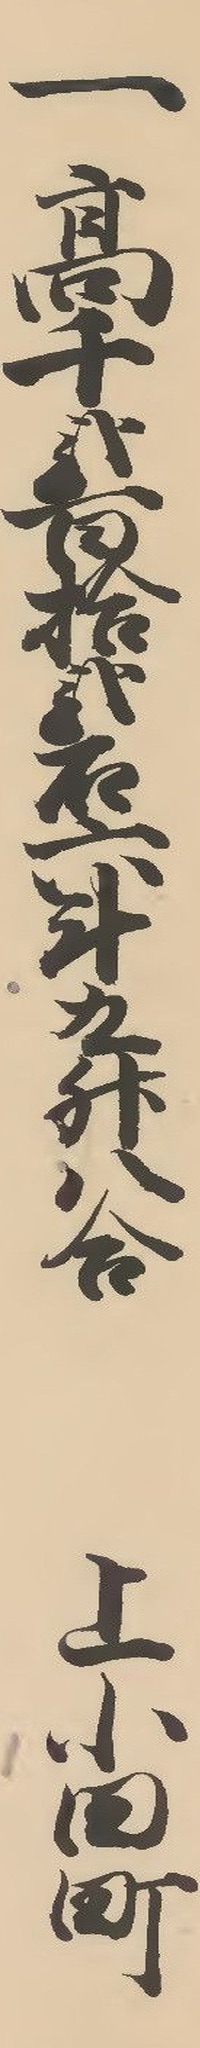一髙千弐百拾弐石六斗九升八合上小田町
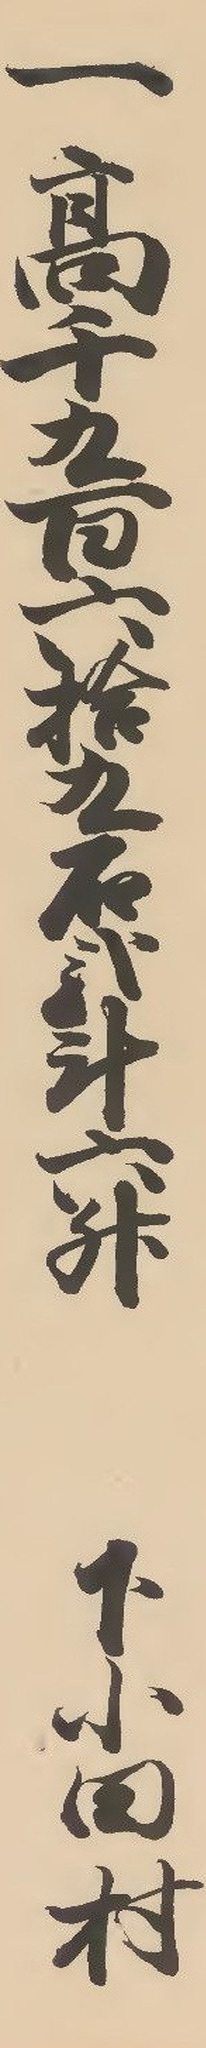一髙千九百六拾九石弐斗六升下小田村
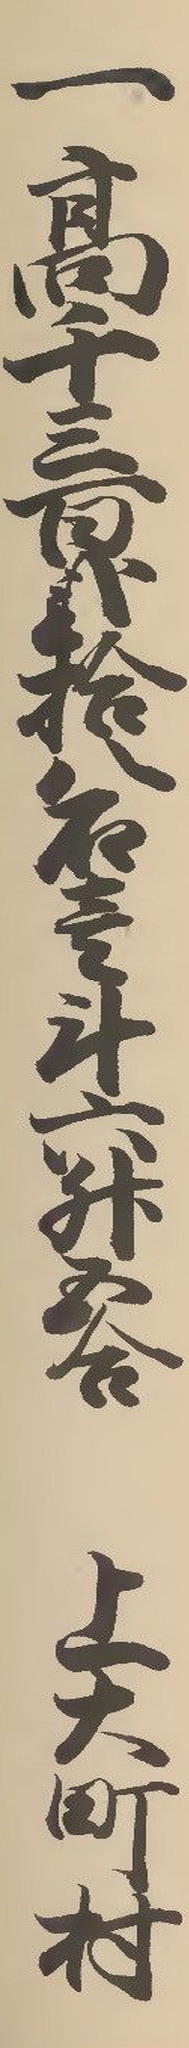一髙千三百弐拾八石壱斗六升五合上大町村
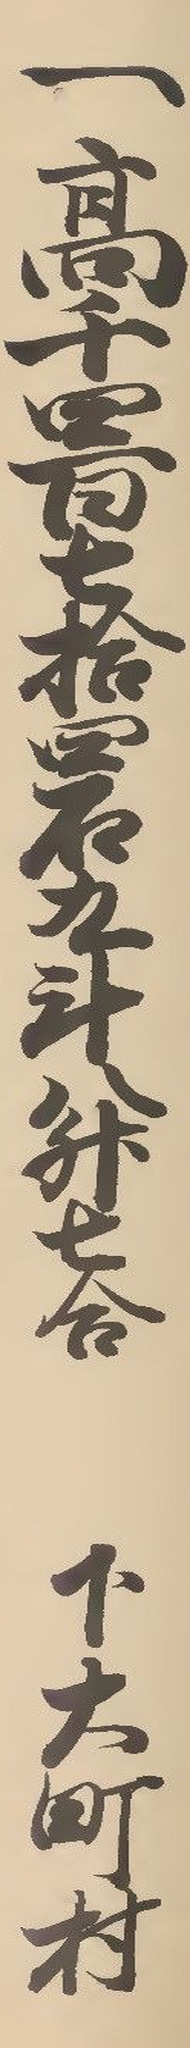一髙千四百七拾四石九斗八升七合下大町村
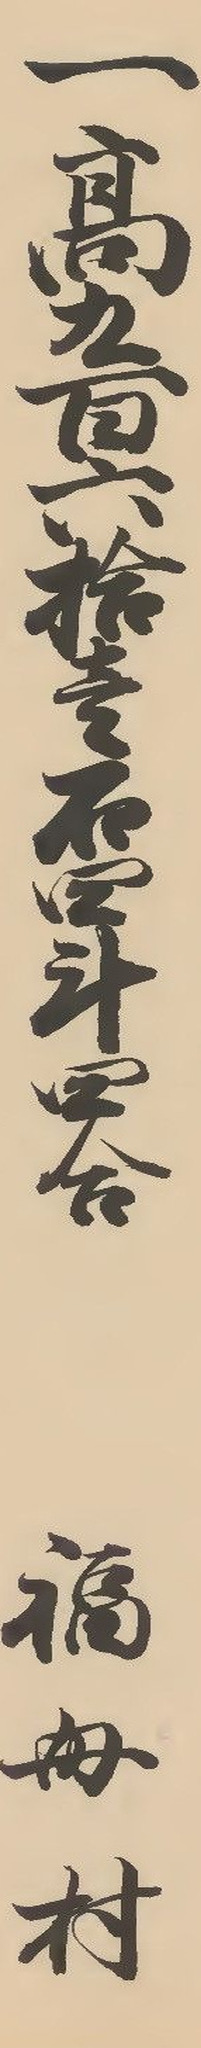一髙九百六拾壱石四斗四合福母村
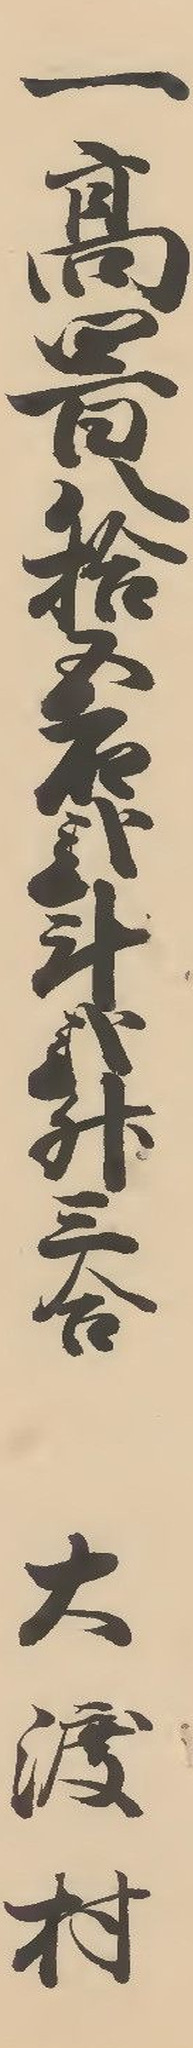一髙四百八拾五石弐斗弐升三合大渡村
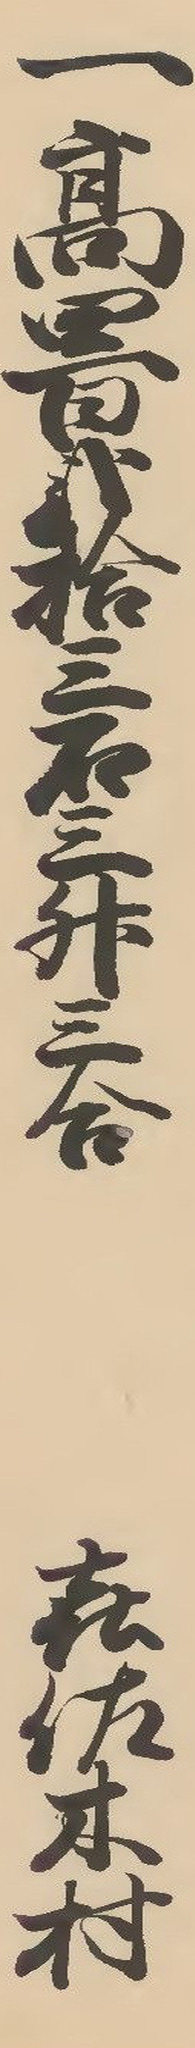一髙四百弐拾三石三升三合喜佐木村

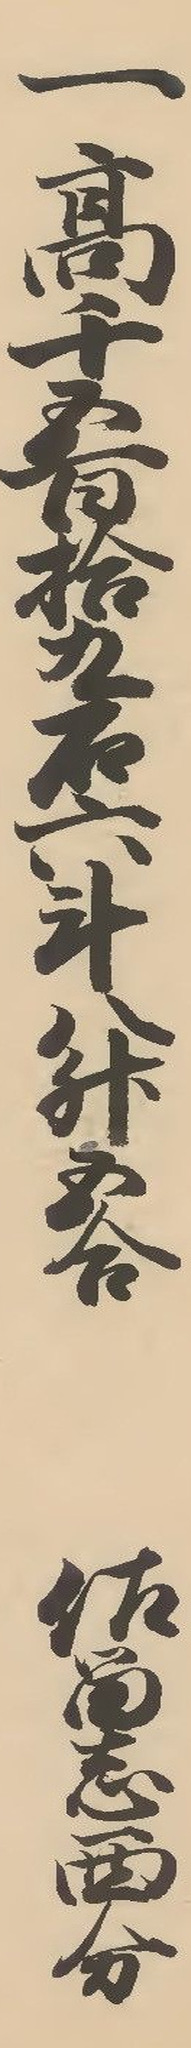一髙千五百拾九石六斗八升五合佐留志西分
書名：肥前国郷帳
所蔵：国立公文書館 National Archives of Japan
